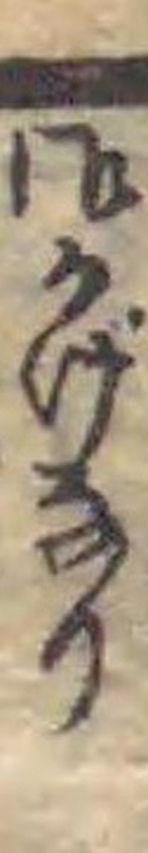御かげなり
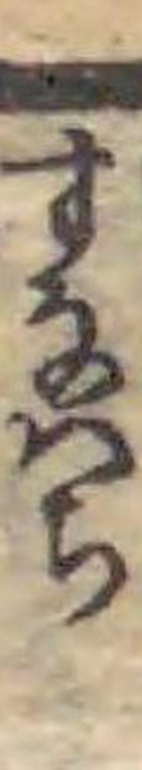すなはち
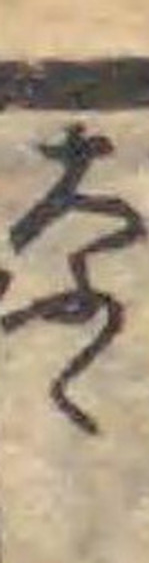大ふく
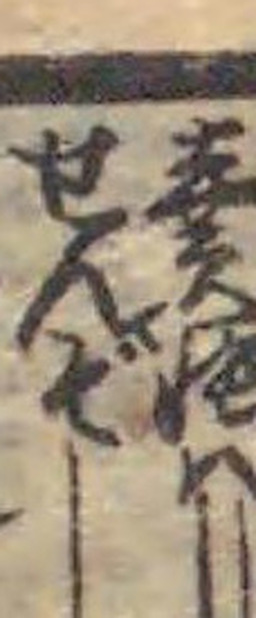せんぞ
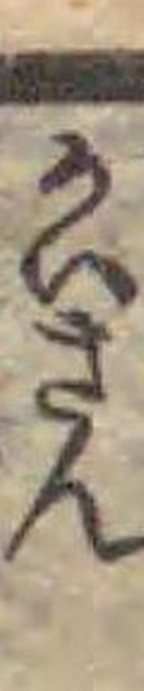かいさん
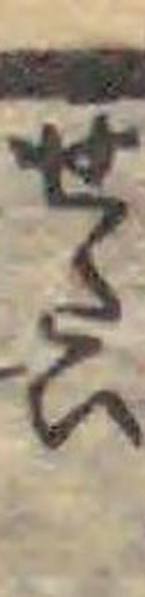せたい
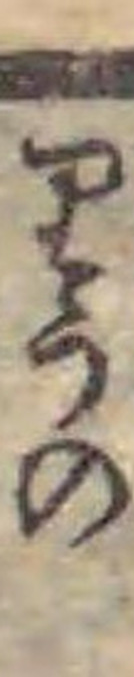しうの
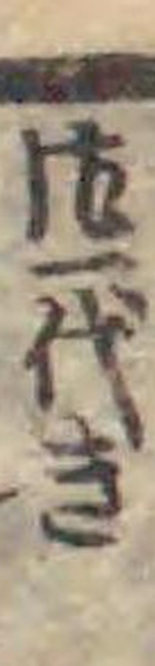御一代き
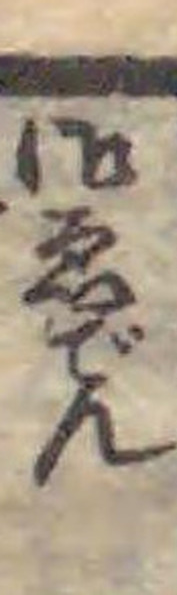御ゑでん
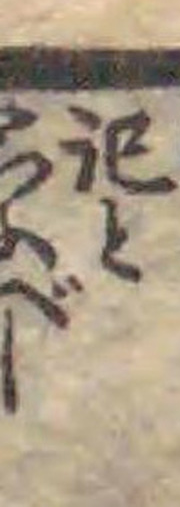思ふべし
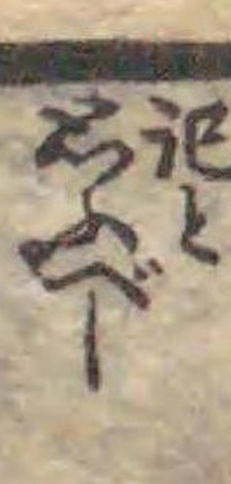思ふべし

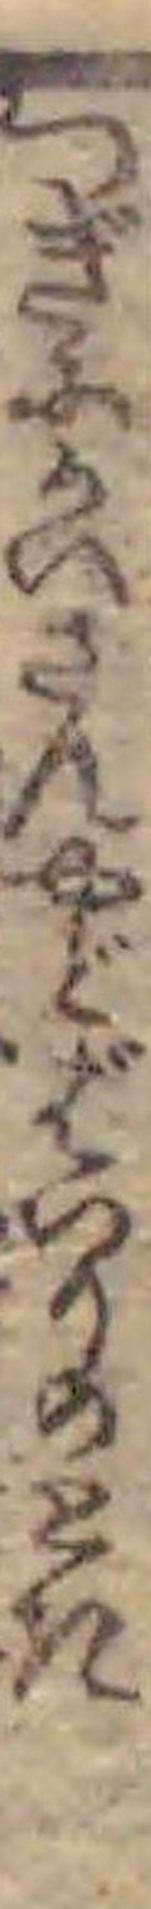つぎにかいさんやどばいりのとき
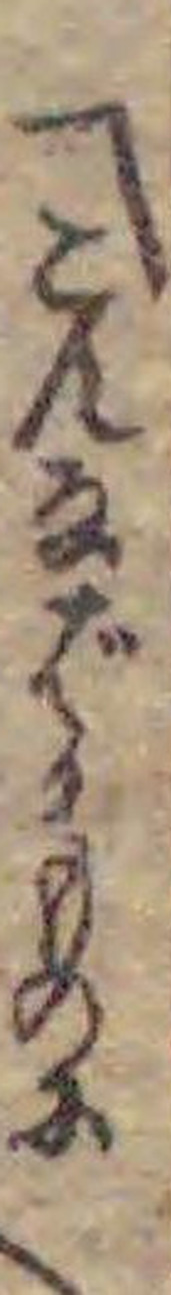〽こんなばかものに
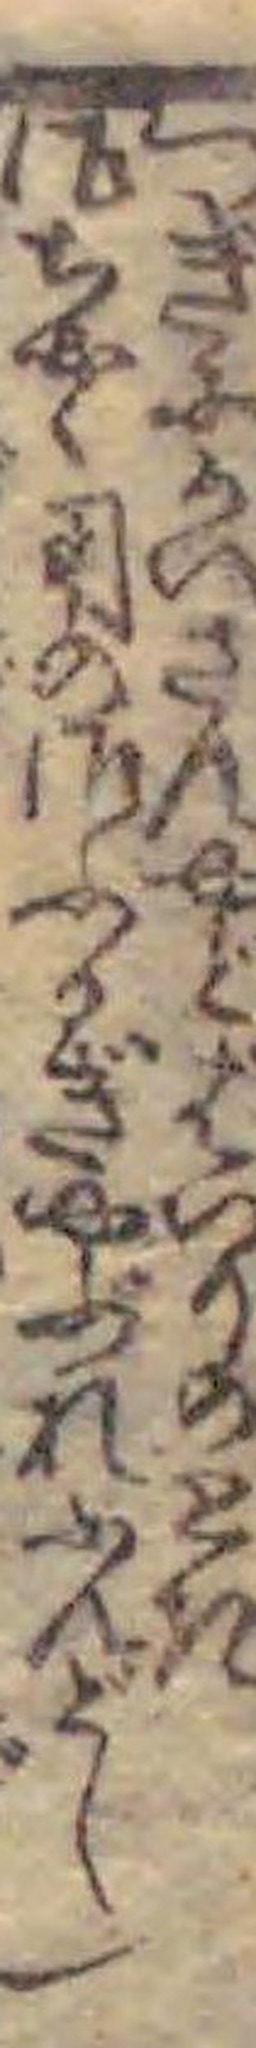御ちやく用の御ふるぎやぶれふんどし
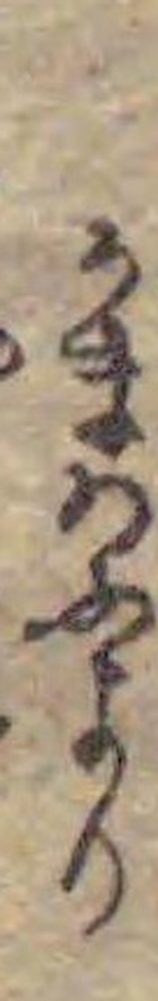かまはふより
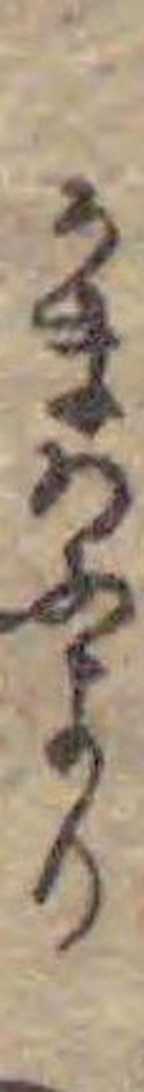かまはふより
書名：身体開帳略縁起 : 3巻
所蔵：国立国会図書館 National Diet Library, JAPAN
